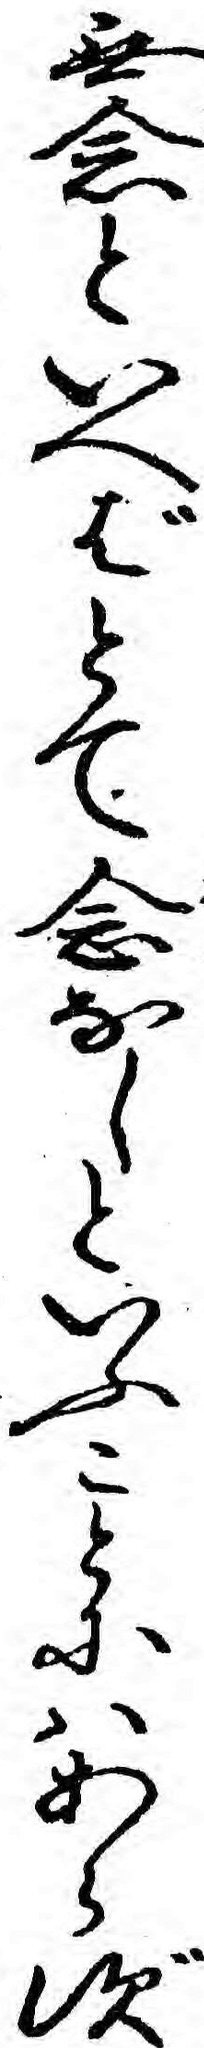無念といへばとて念なしといふことにはあらず
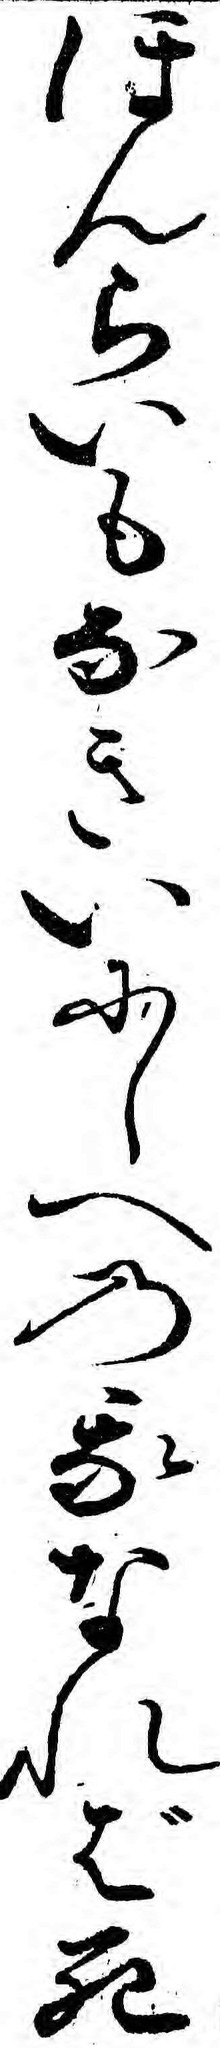ほんらいもなきいにしへの我なれば死
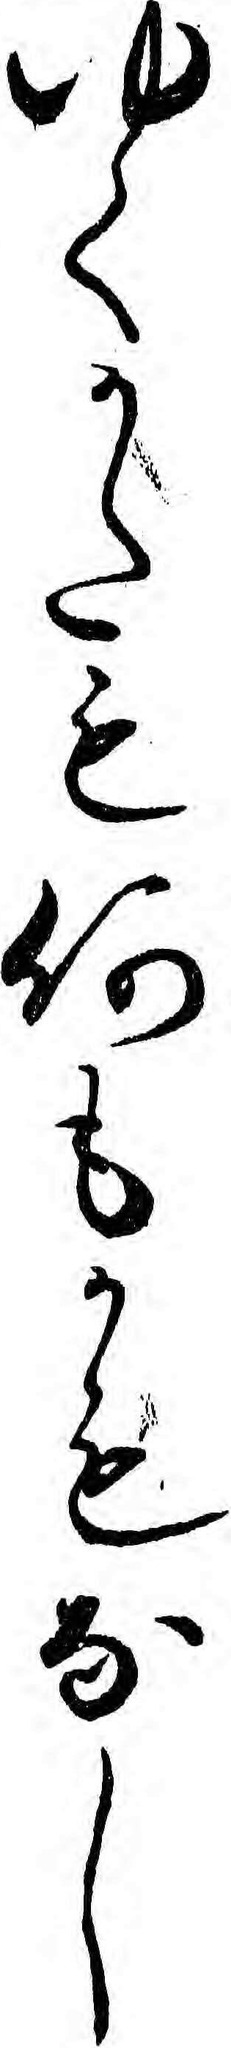ゆくかたも何もかもなし
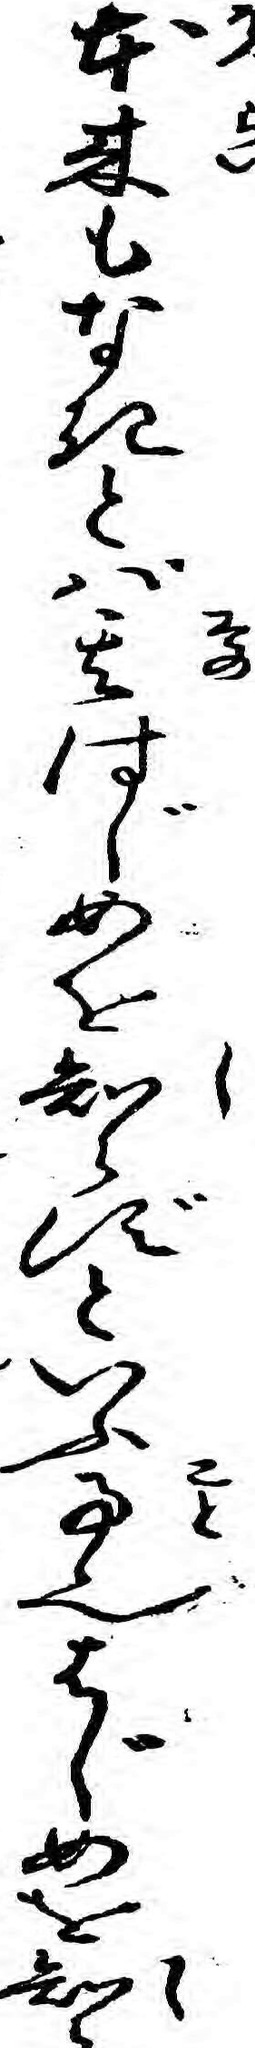本来もなきとは其はじめを知らずといふ事也はじめを知ら
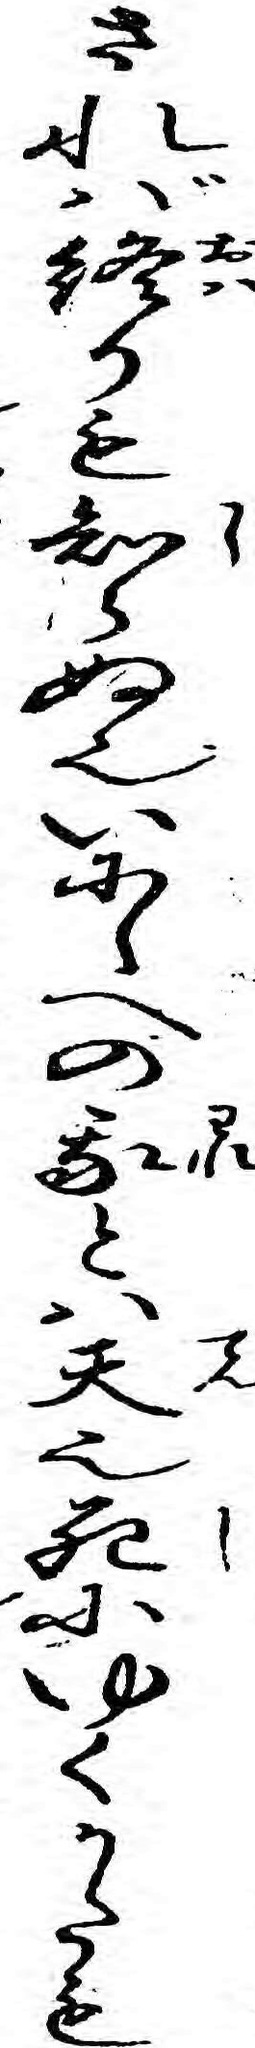されば終りも知らぬ也いにしへの我とは天也死にゆくかたも
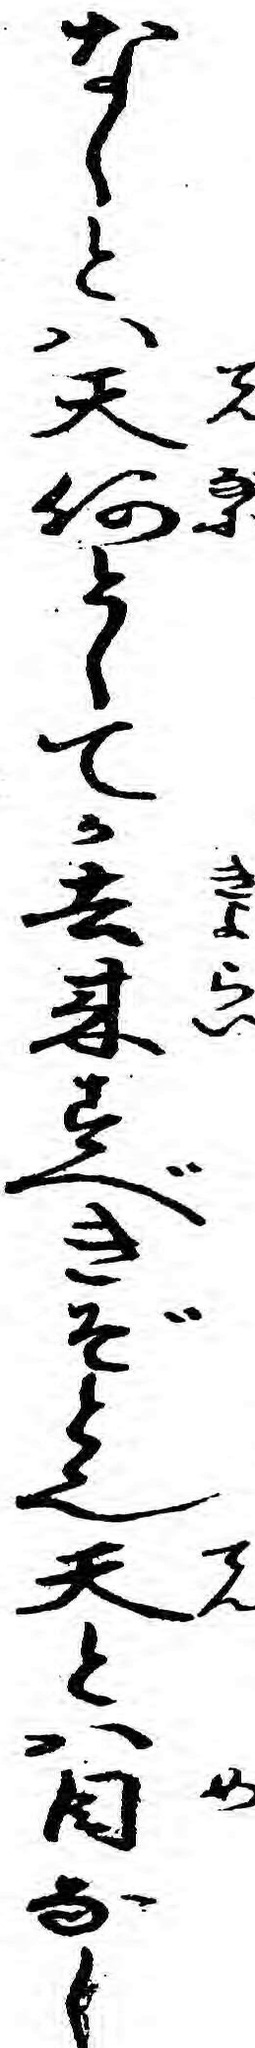なしとは天何としてか去来すべきぞと也天とは目なし
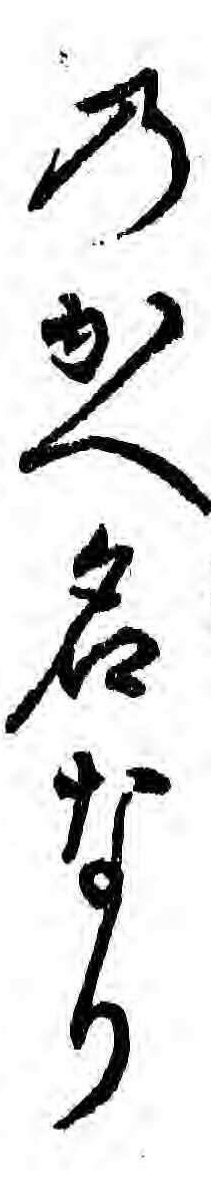のかへ名なり
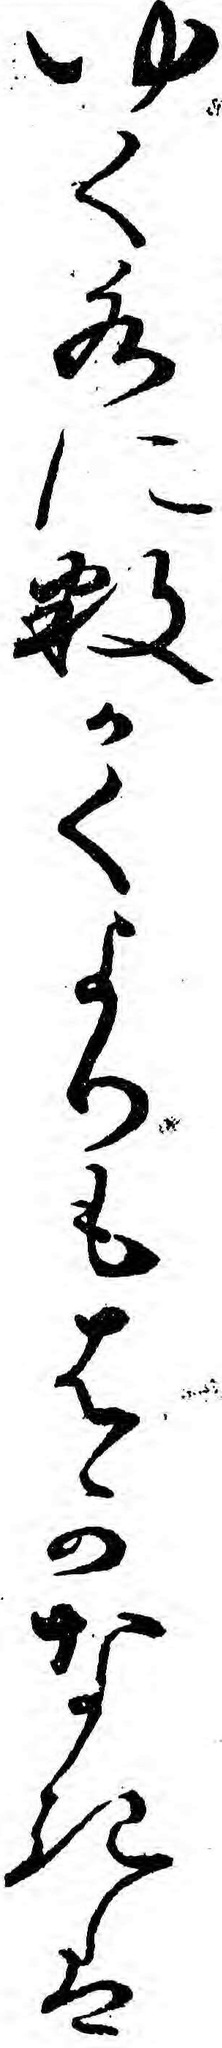ゆく水に数かくよりもはかなきは
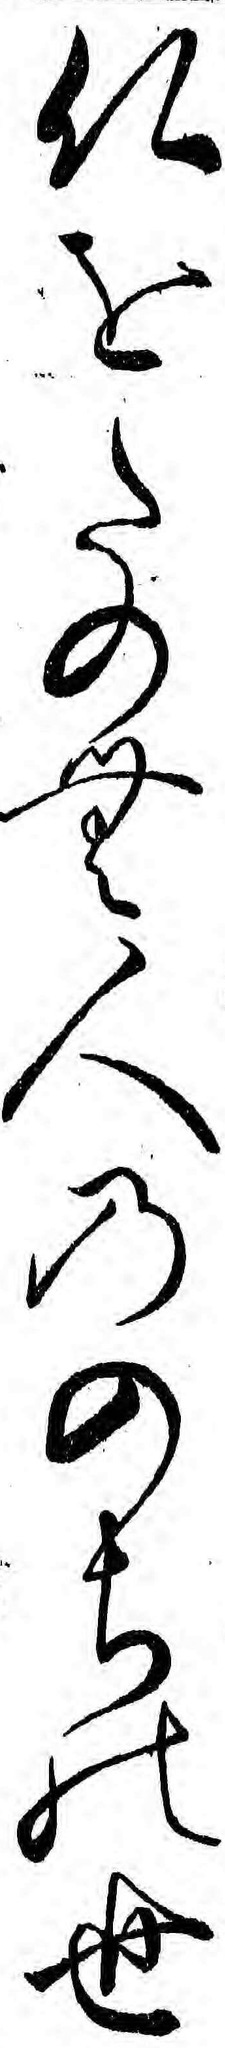仏をたのむ人のちの世
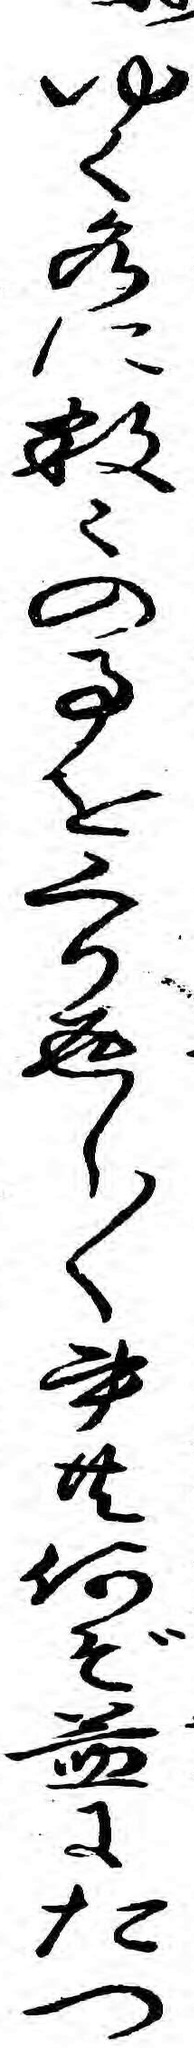ゆく水に数々の事をくり返し〳〵書共何ぞ益にたつ
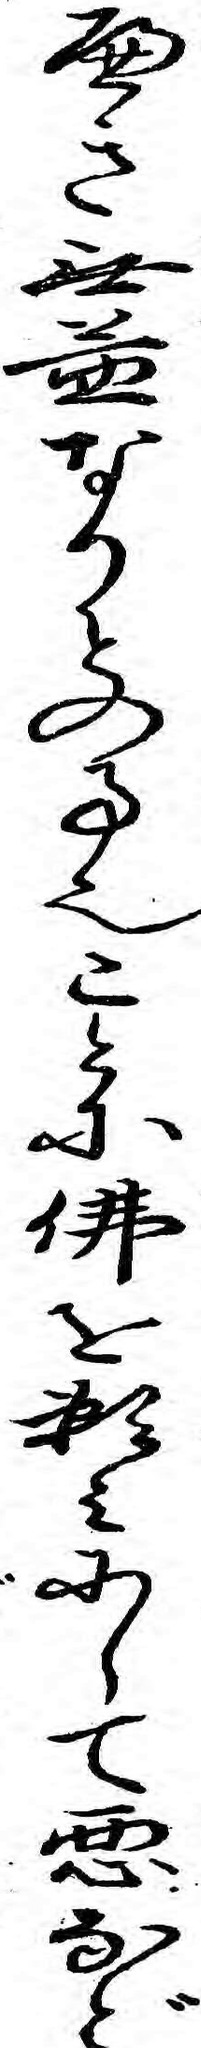へき無益なりとの事也ことに仏を頼みにして悪など
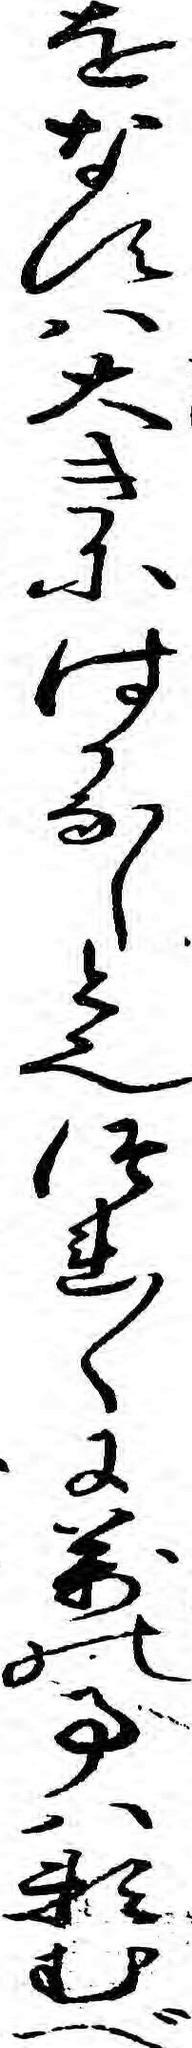をなすは大きにはかなしと也つれ〳〵に万の事は頼むべ
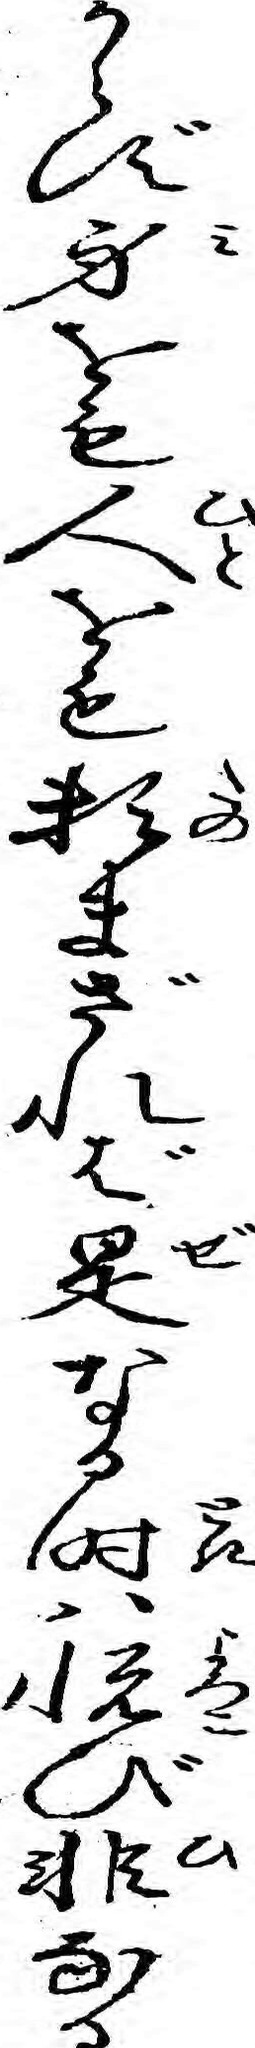からず身をも人をも頼まざれば是なる時は悦び非なる
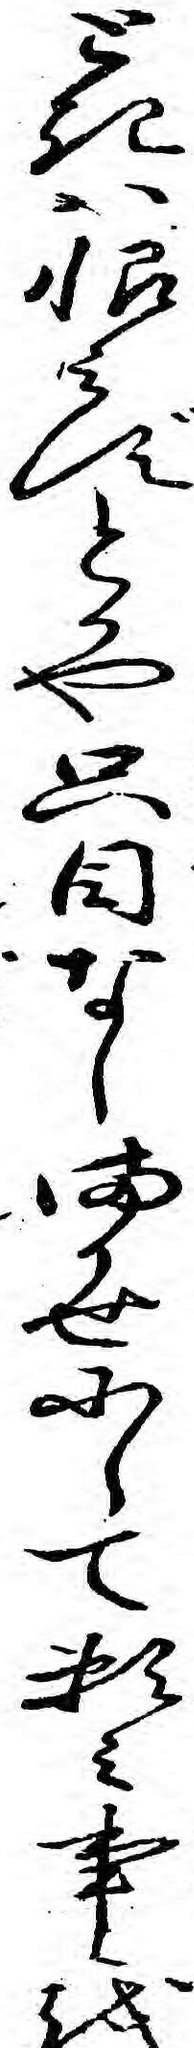ときは恨みずとかや只目なしまかせにして頼み事を
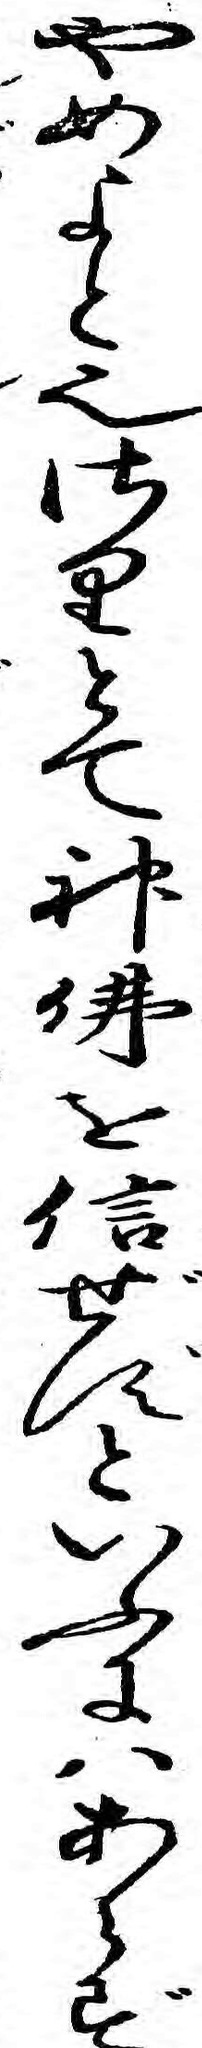やめよと也さりとて神仏を信ぜずといふにはあらず
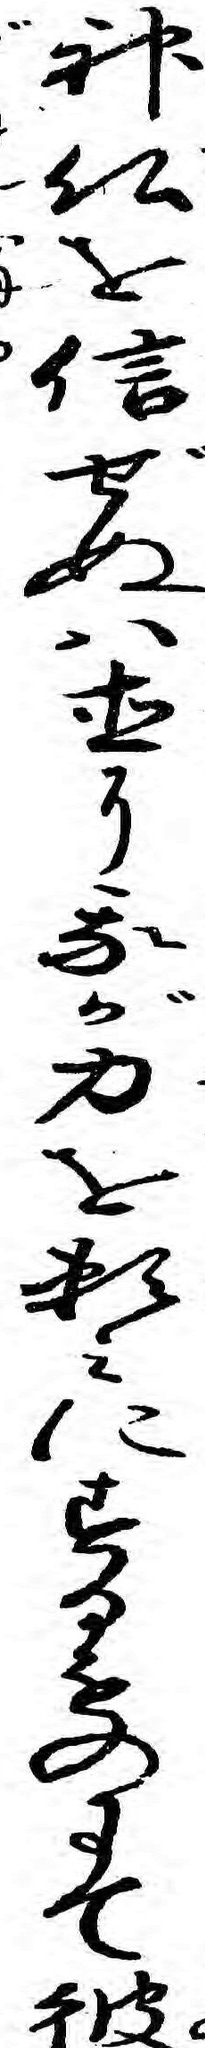神仏を信ぜぬは直に我が力を頼みにするものにて彼
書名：目なし用心抄
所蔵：国文学研究資料館
